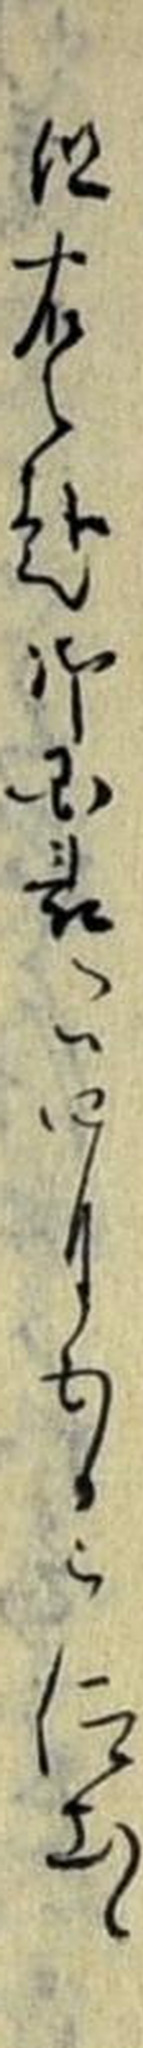但右之趣御国表ヘハ四月五日被仰出候
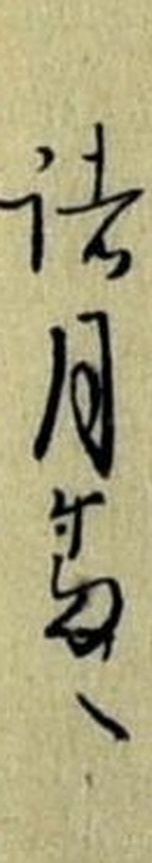諸月番へ
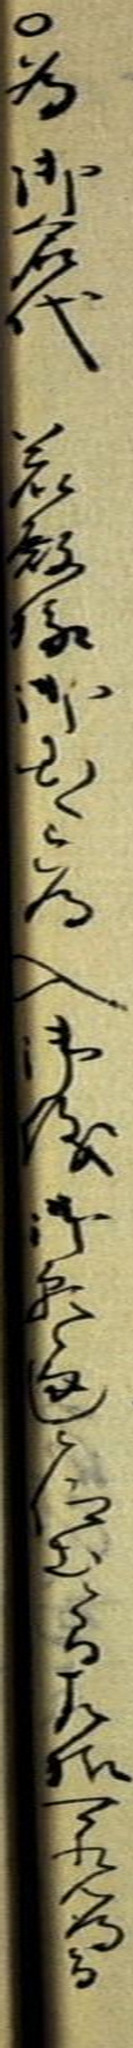〇為御名代若殿様御国へ被為入御義御願之通被仰出候間左様可相心得旨
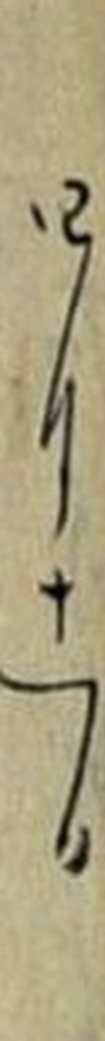四月十一日
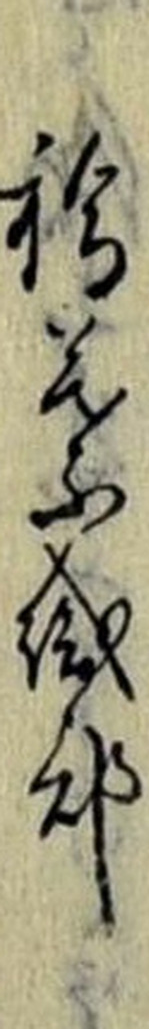稲葉織部
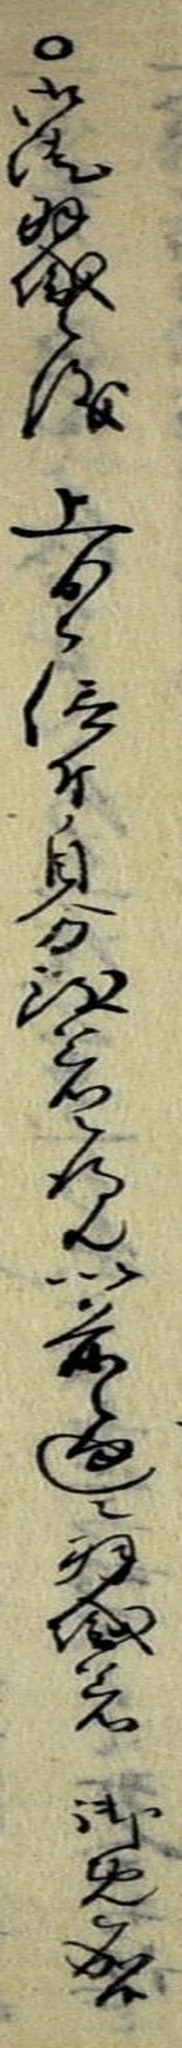〇御徒羽織之儀上ゟ被仰付自分致着候得共以前之通ニ羽織着御免被成候
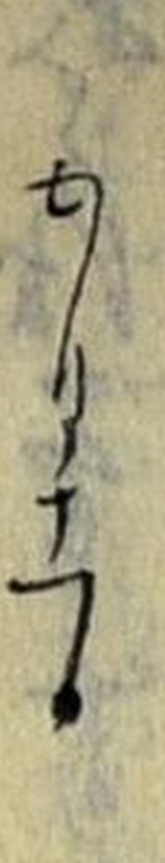五月十一日
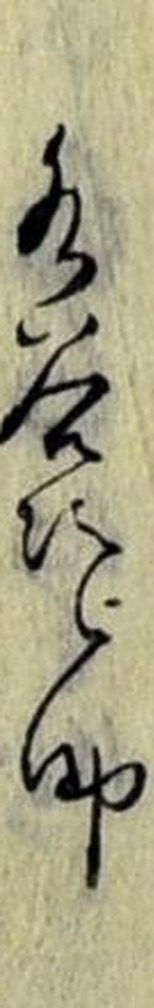水谷次郎助
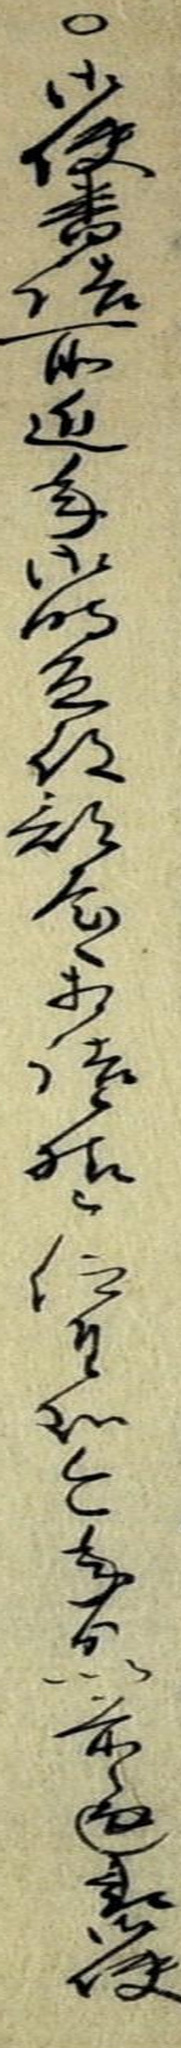〇御使番詰所近年御時宜役部屋へ相詰候様被仰付候処今年ゟ以前之通り御使
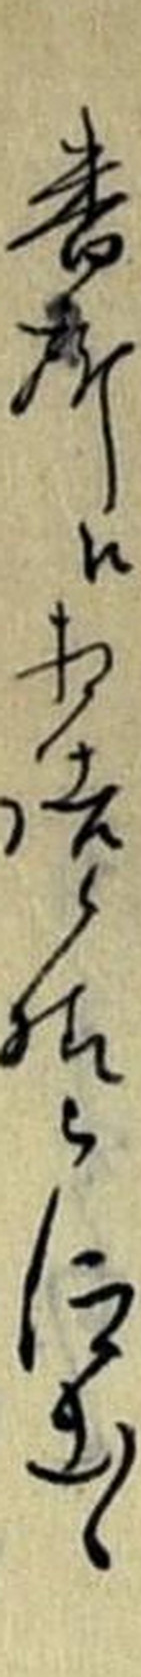番所江相詰候様被仰出候
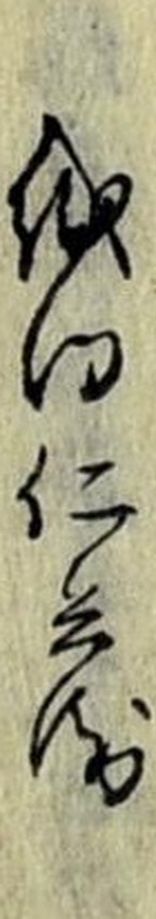織田仁兵衛
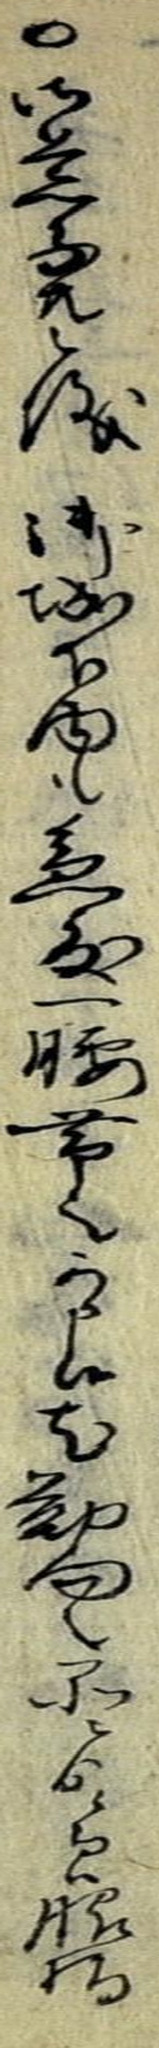〇御荒子共之儀御城下内も急度一腰帯之可申候尤勤向之品ニゟニ而ハ脇指
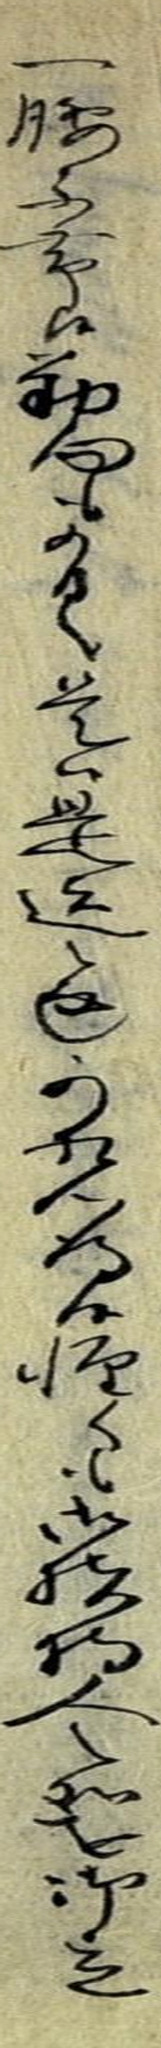一腰不帯候勤向も有之是ハ是迄之通可相心得候軽くも御指物人之処を御立
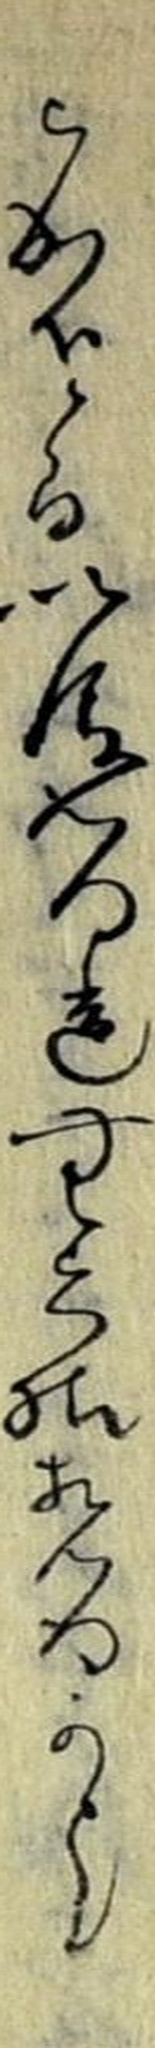被成下候間以後心得違無之様相心得可申候
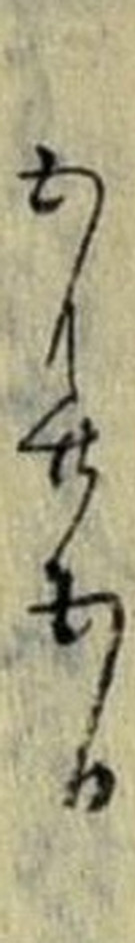五月廿五日
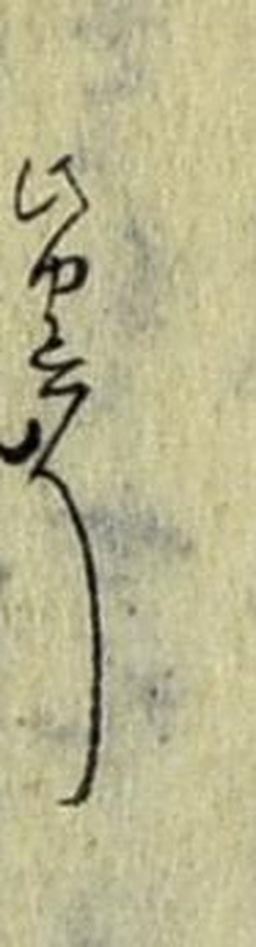此内壱人
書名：命令之部 三
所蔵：福井県文書館 Fukui Prefectural Archives
